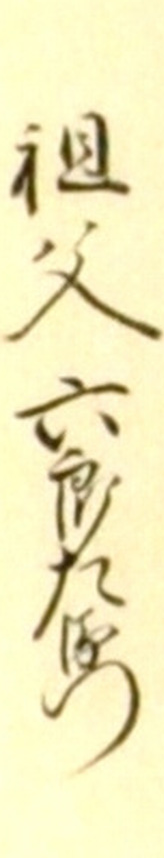祖父六郎左衛門

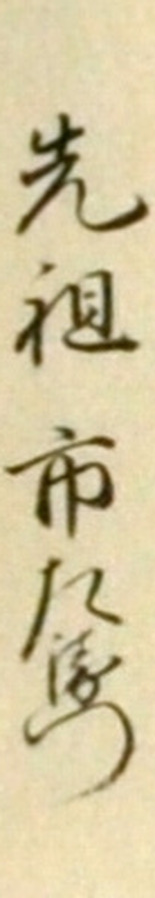先祖市左衛門
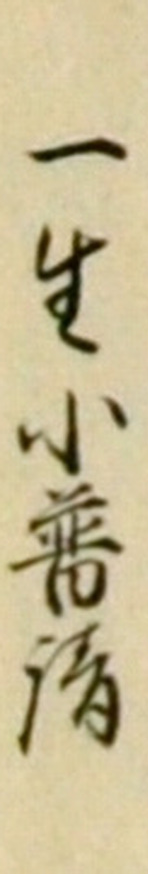一生小普請
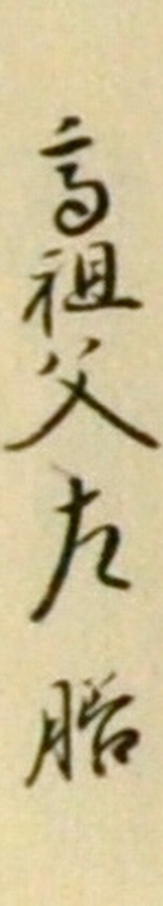高祖父左膳
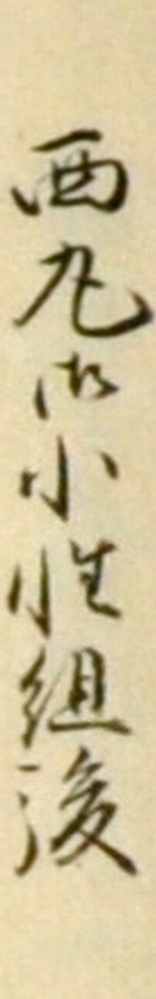西丸御小姓組後
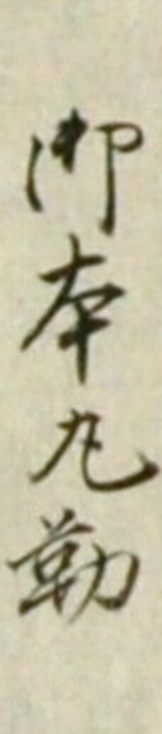御本丸勤
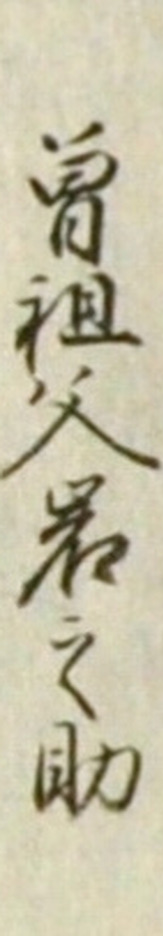曽祖父岩之助
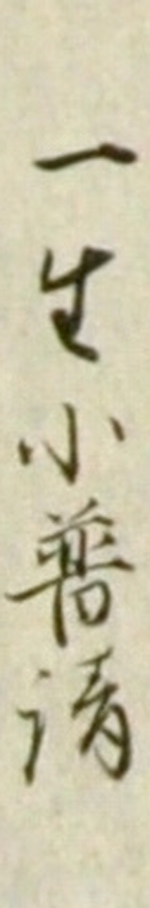一生小普請
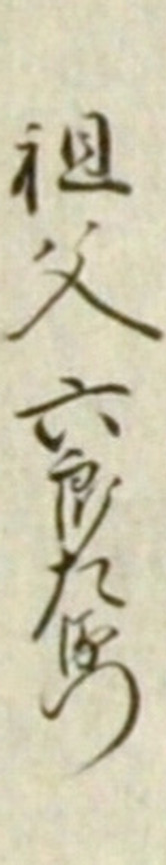祖父六郎左衛門
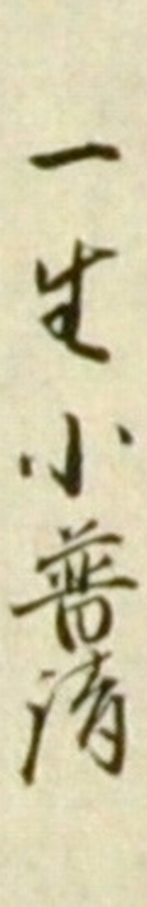一生小普請
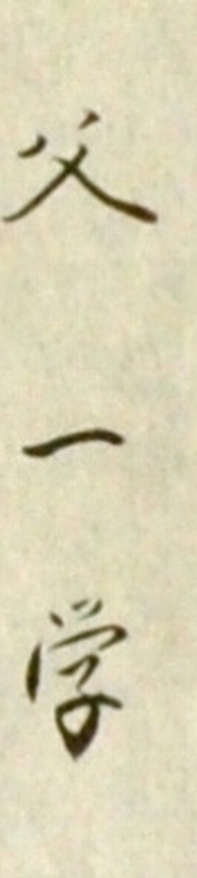父一学
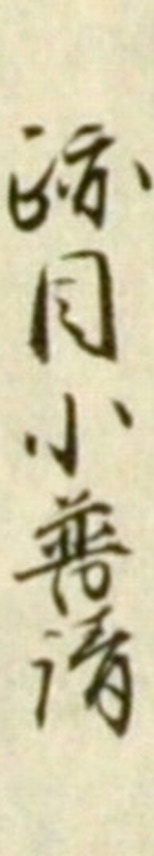跡目小普請
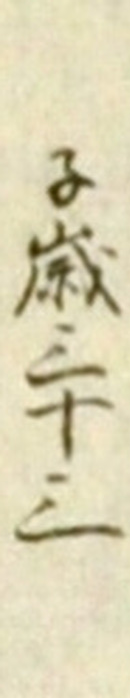子歳三十三
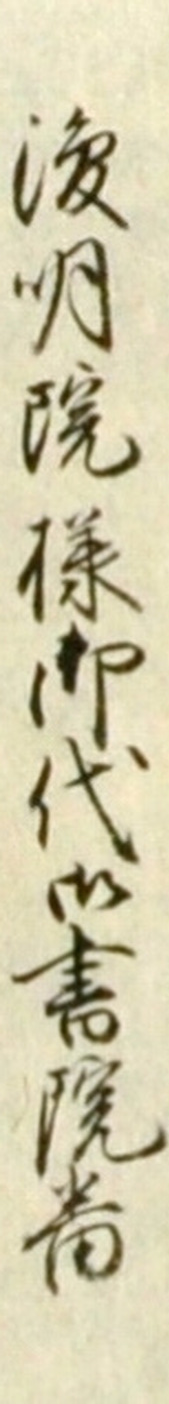凌明院様御代御書院番
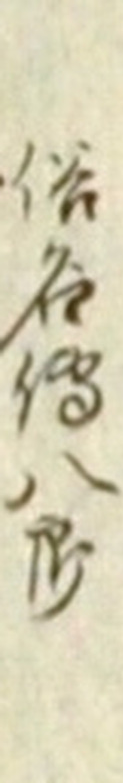俗名傳八郎
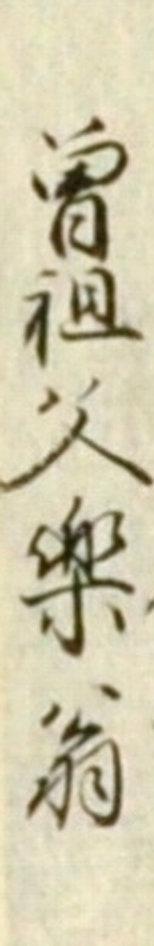曾祖父楽翁
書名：若年寄御役中御調書付
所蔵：伊那市立高遠町図書館・合同会社AMANE
